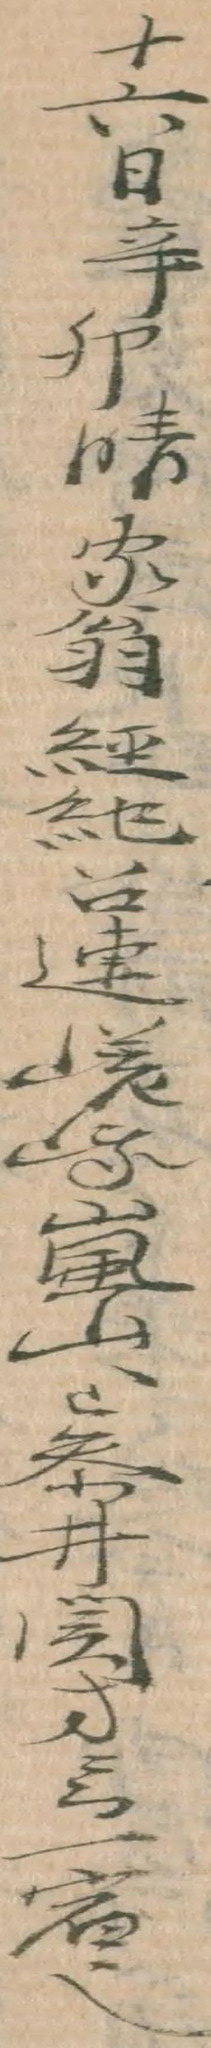十六日辛卯晴家翁経紀召連嵯峨嵐山へ被参井関方ニ而一宿也
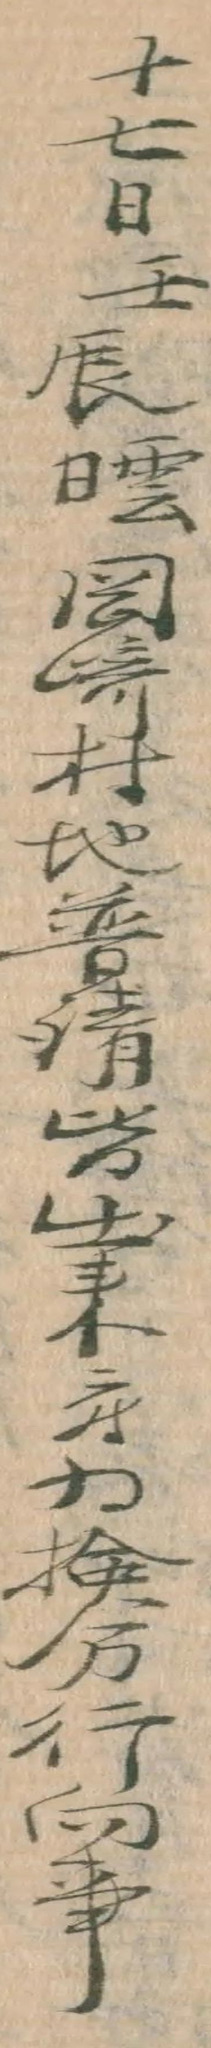十七日壬辰曇岡崎村地普請皆出来ニ付為検分行向事
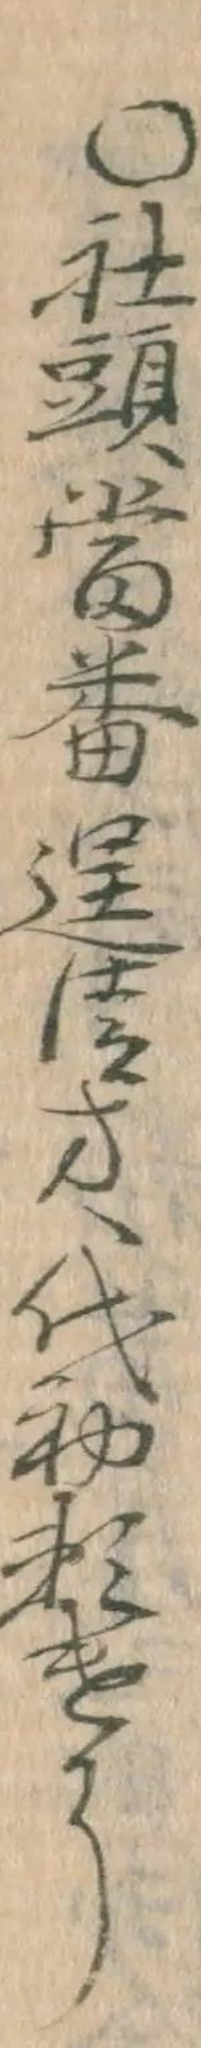○社頭當番逞清方へ代勤頼遣了
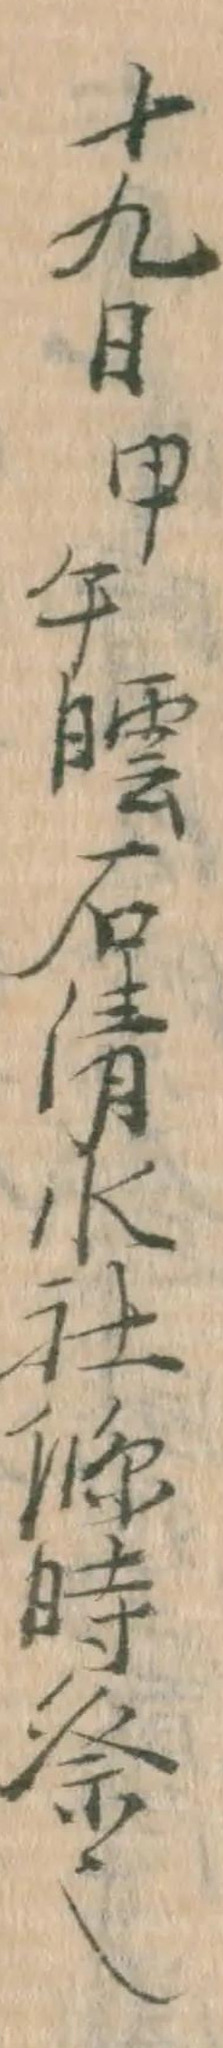十九日甲午曇石清水社臨時祭也
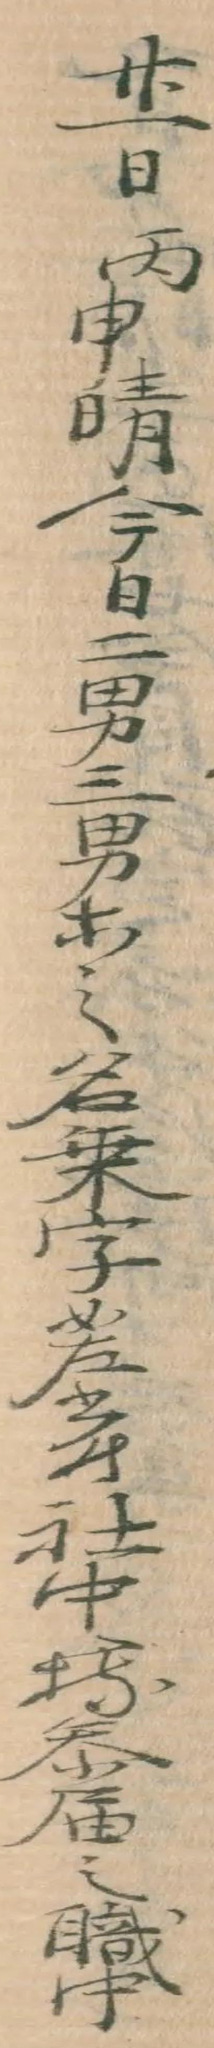廿一日丙申晴今日二男三男等之名乗字如左書付社中持参届之職中
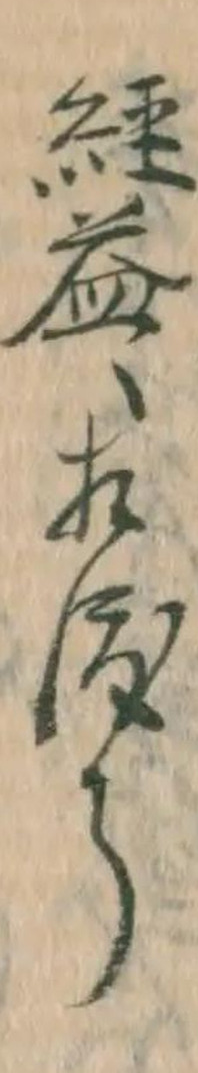経益へ相渡了
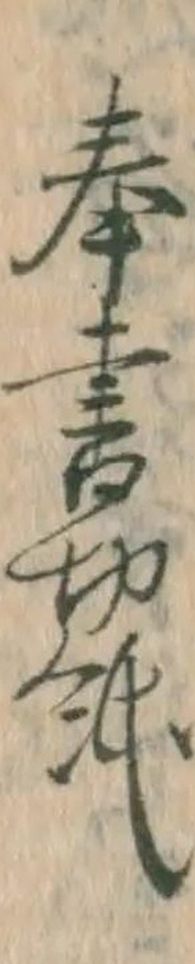奉書切紙
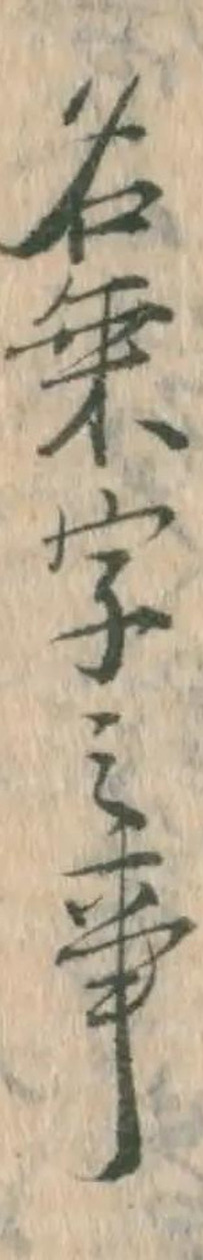名乗字之事
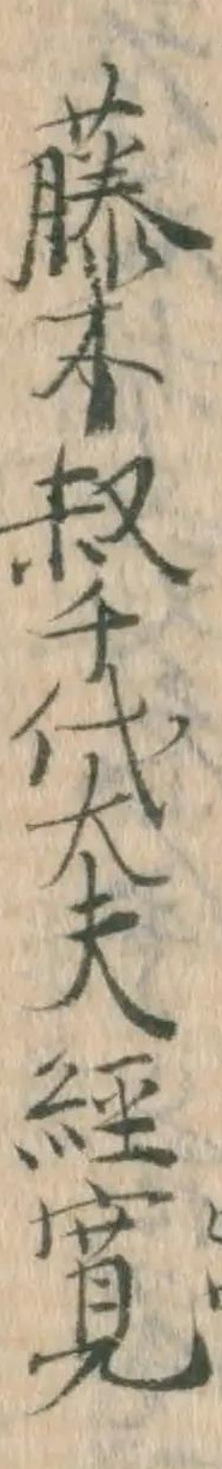藤木叔千代大夫経寛
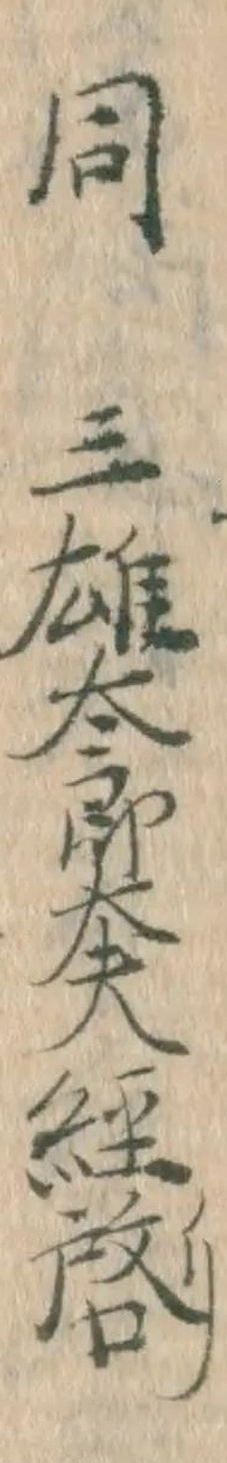同三雄太郎大夫経啓
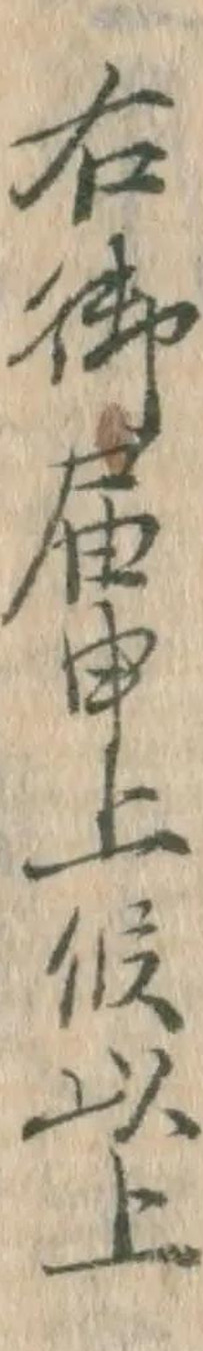右御届申上候以上
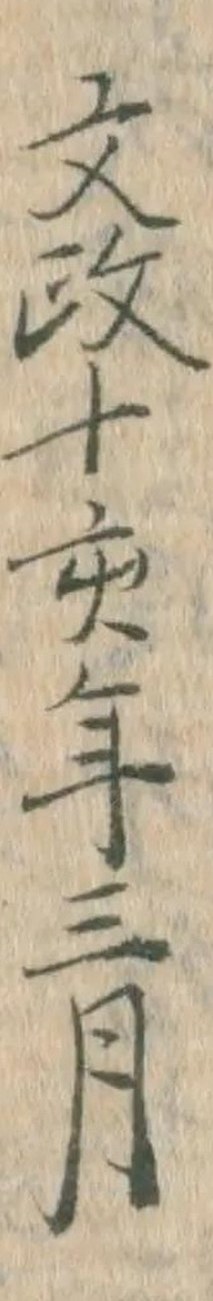文政十亥年三月
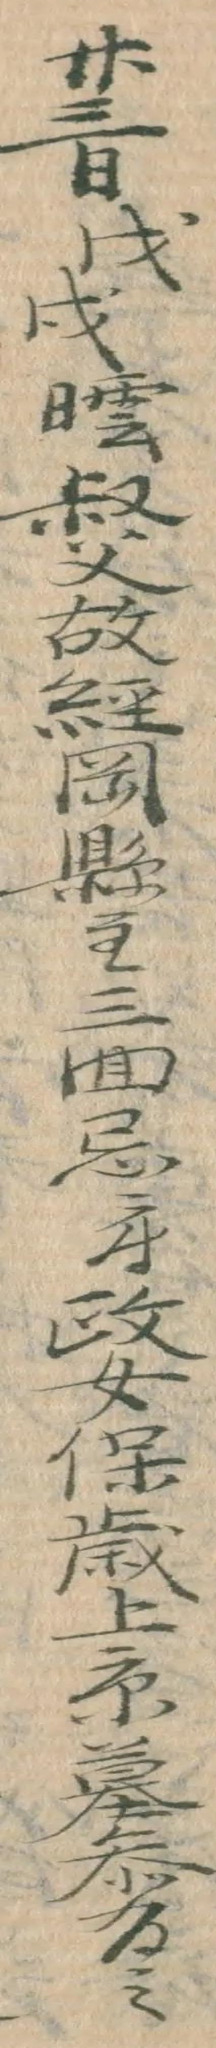廿三日戊戌曇叔父故経岡縣主三回忌ニ付政女保歳上京墓参有之
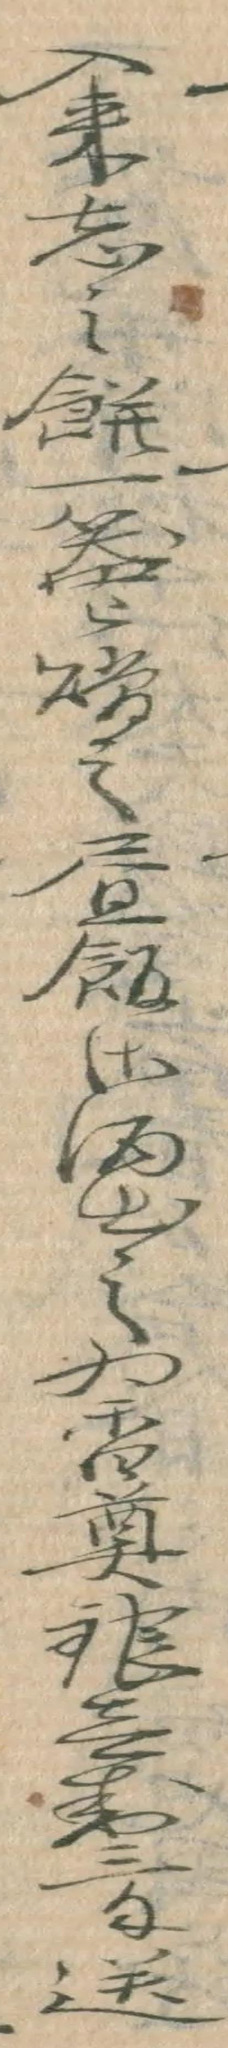入来志之餅一器被賄之昼飯御酒出之為香奠銀壱朱三匁送
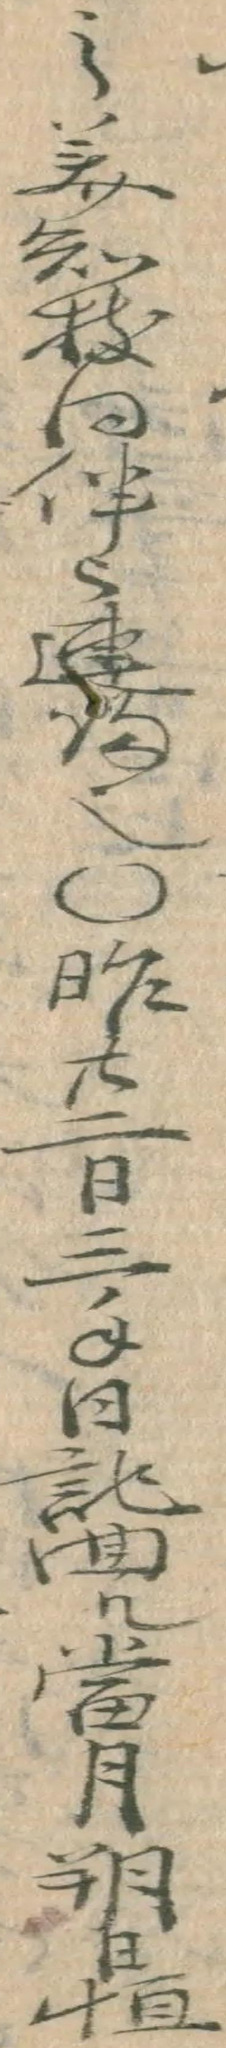之美知枝同伴被連帰也○昨廿二日三手日記回ル當月朔日恒
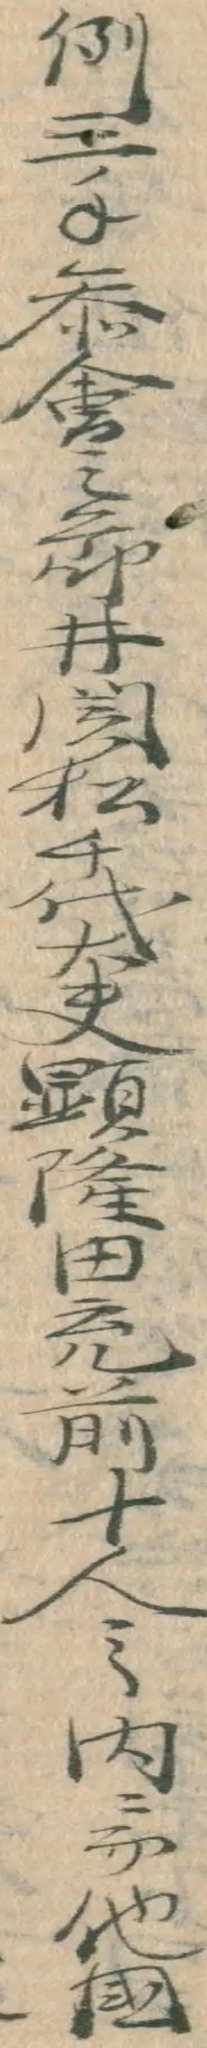例三手参會之節井関松千代大夫顕隆田充前十人之内ニ而他國
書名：賀茂社記録. 第65冊
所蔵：国立国会図書館 National Diet Library, JAPAN
